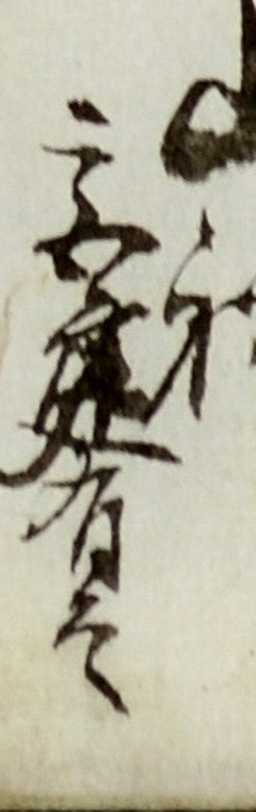宮建有之

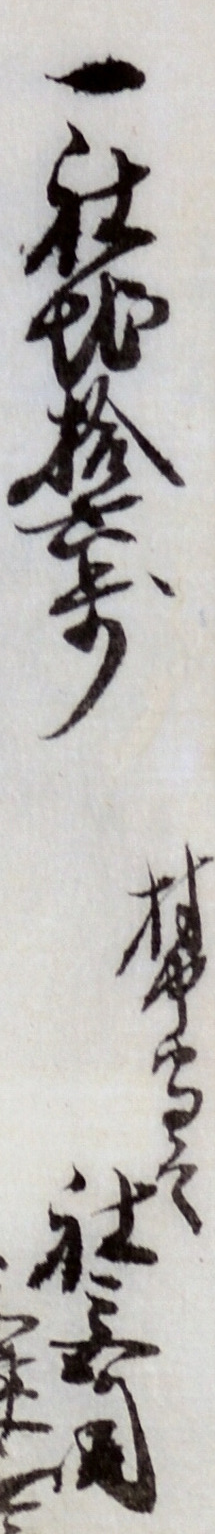一社地拾六歩社宮司
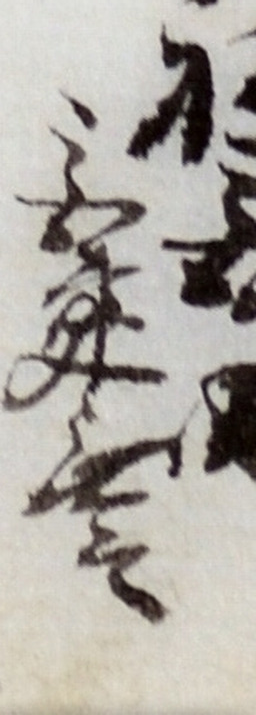宮建無之
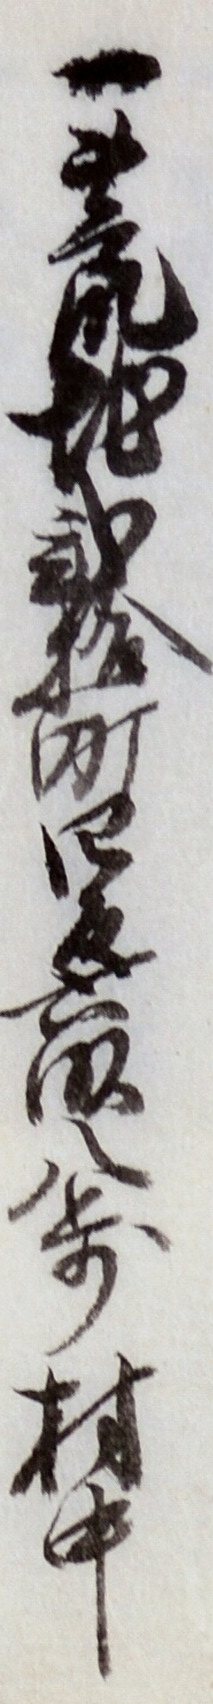一荒地弐拾町四反六畝八歩村中
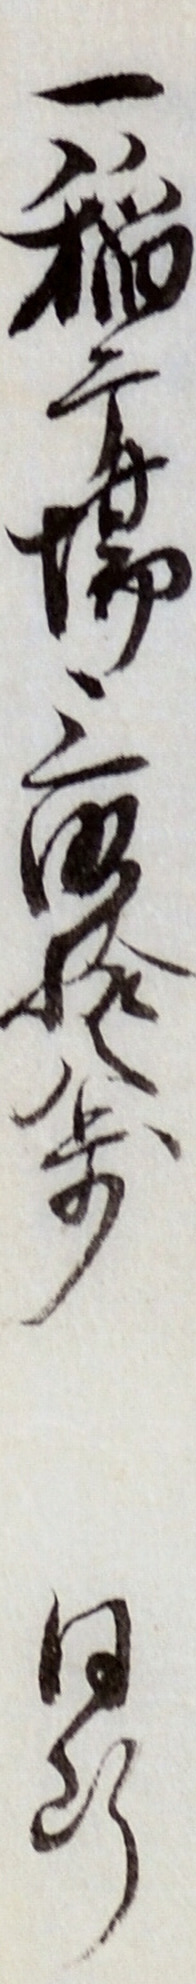一稲干場三畝拾八歩同断
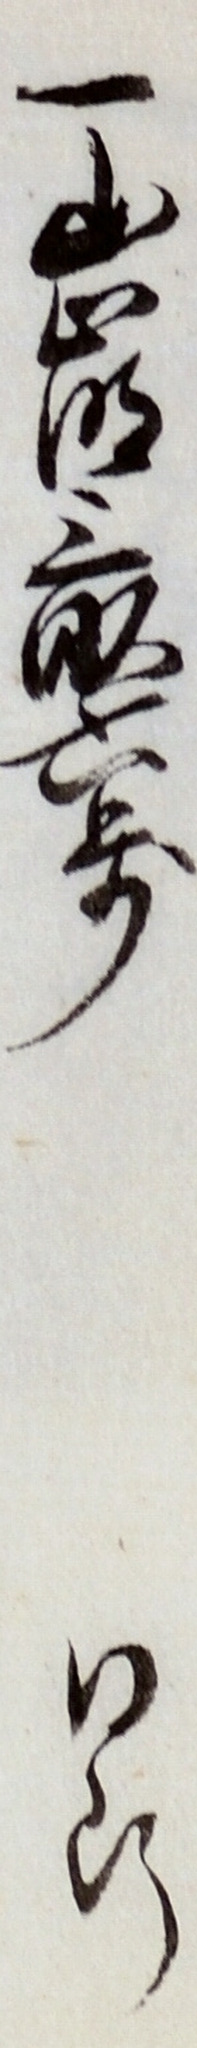一山崩三畝六歩同断
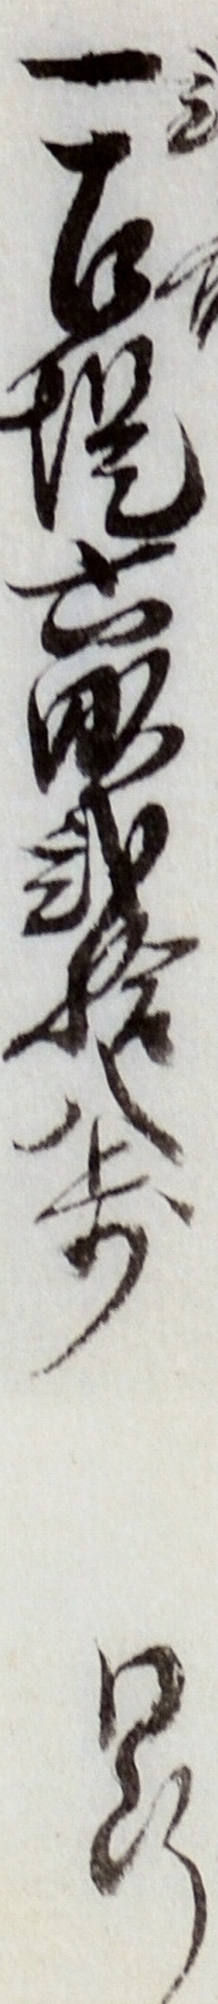一古堤六畝弐拾八歩同断
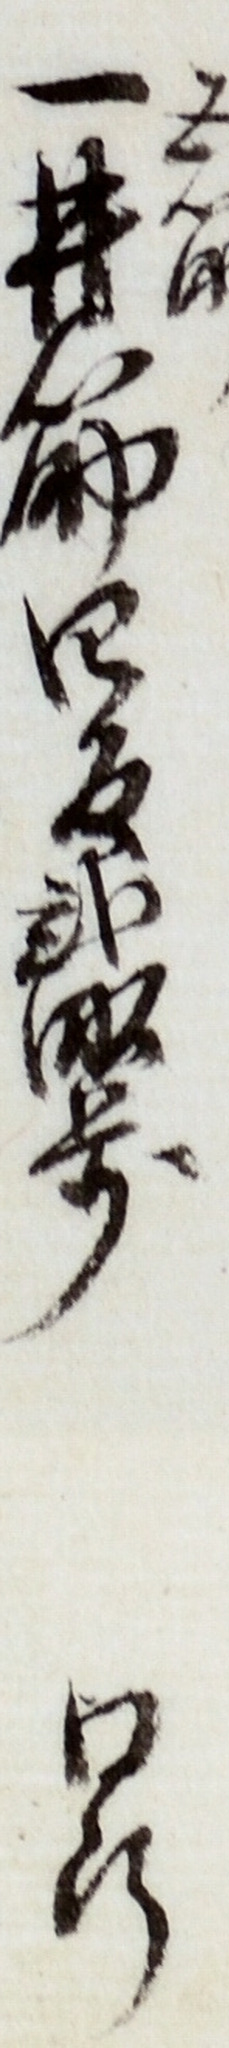一井筋四反弐畝歩同断
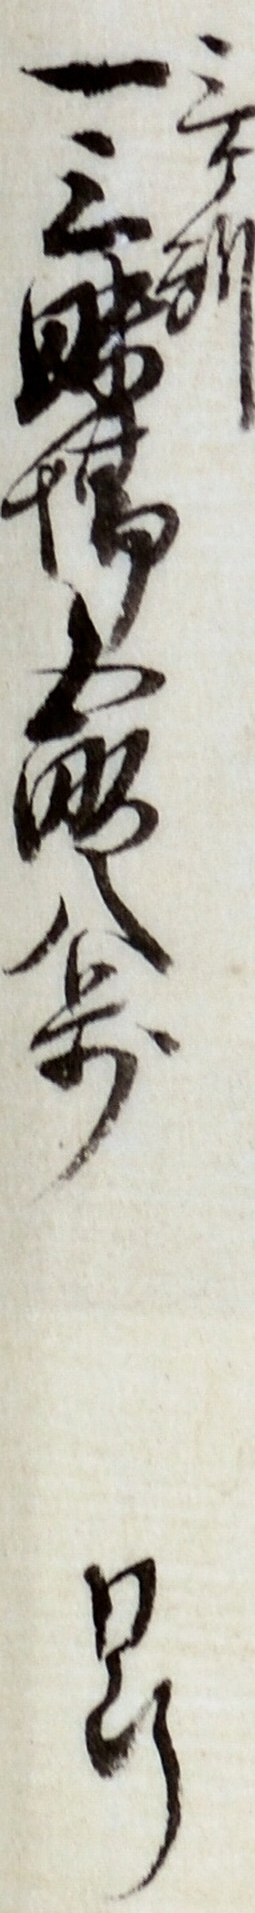一三昧場五畝八歩同断
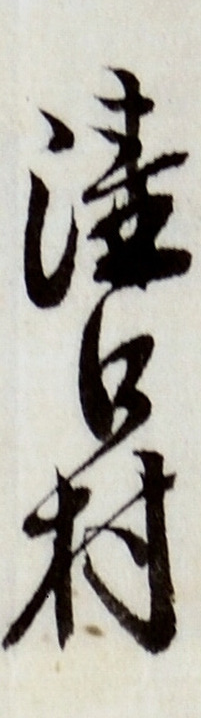溝口村
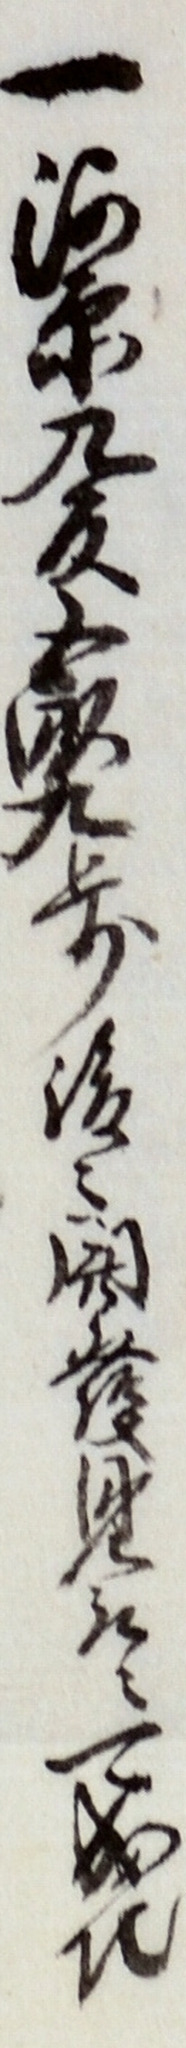一河原九反五畝九歩後々開発見取ニ可成地
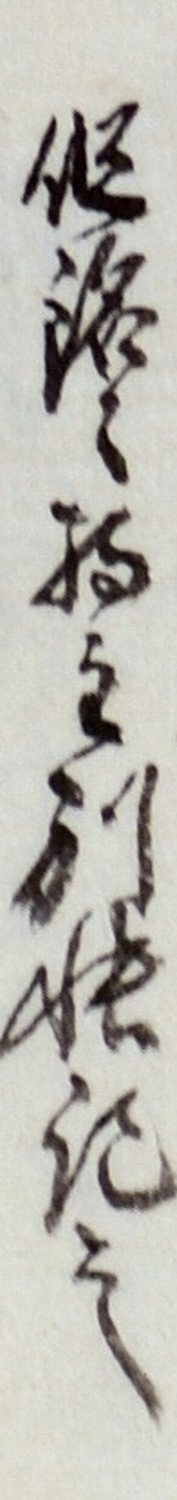但し銘々持主別帳記之
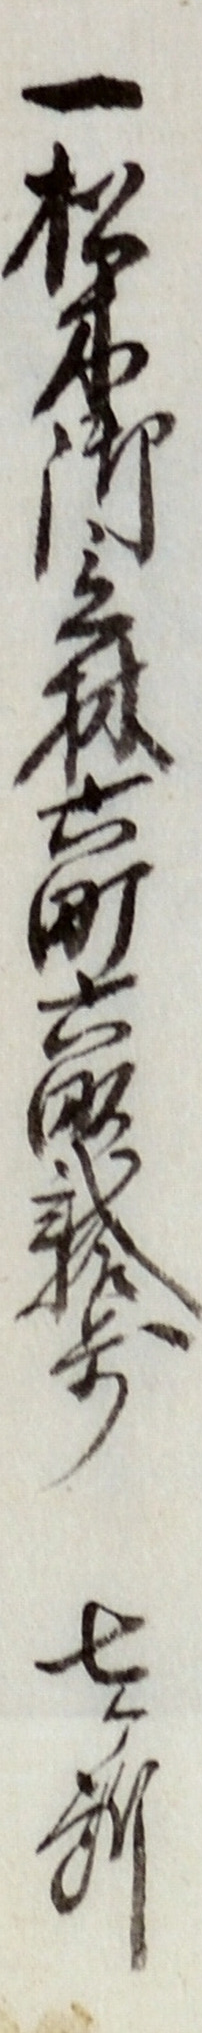一松木御立林六町六畝弐拾歩七ヶ所
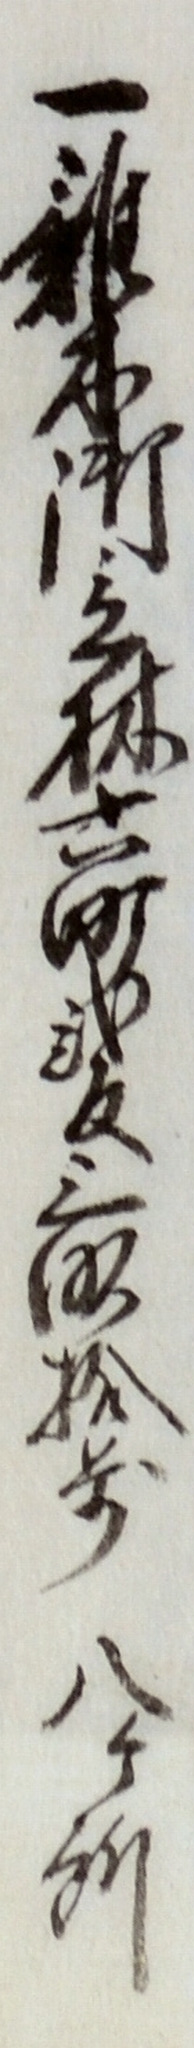一雑木御立林六町弐反三畝拾歩八ヶ所
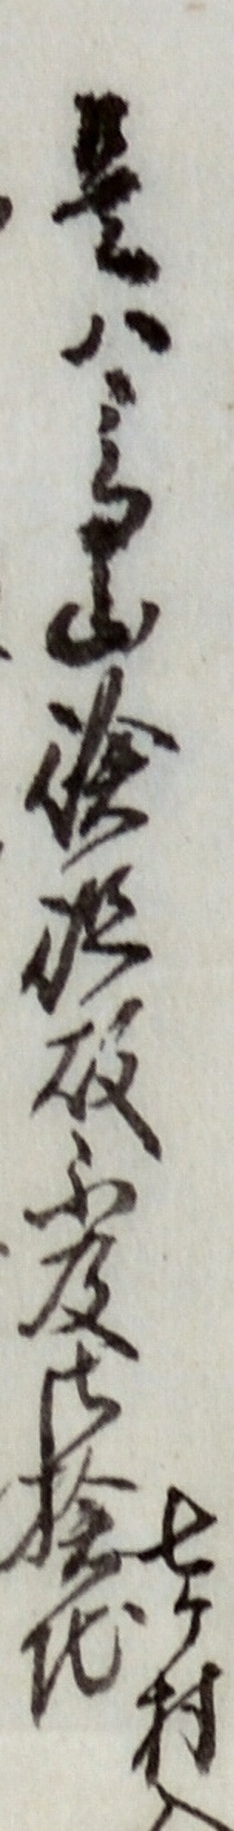是ハ高山嶮岨故不及御検地
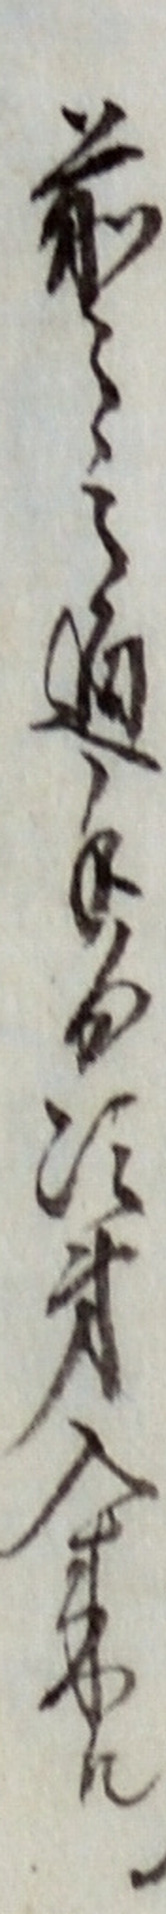前々之通手より次第入来ル
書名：御領分中山林社地手控
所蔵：伊那市立高遠町図書館・合同会社AMANE
